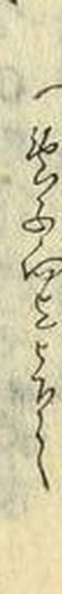台子向迄被下之
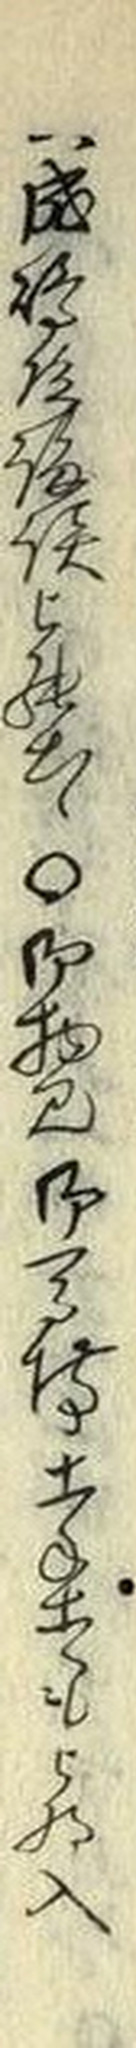一成嶋殿講談被罷出候〇御物見御馬場土手へも被為入
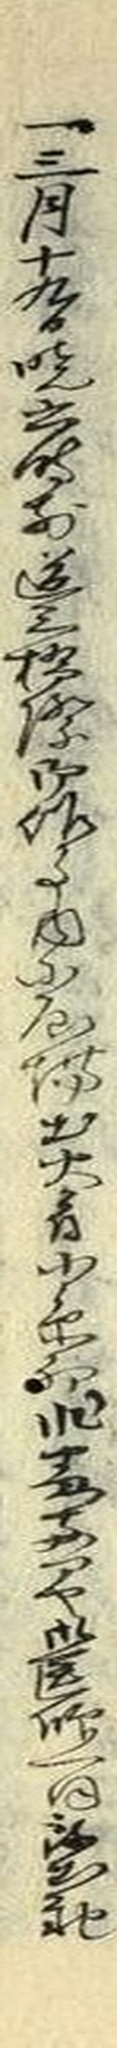一三月十九日暁六時前道三橋際御作事内小屋場出火ニ付小兵衛初非番両部屋御医師一同致出勤
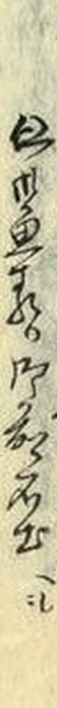但御魚類ハ御前へ不出
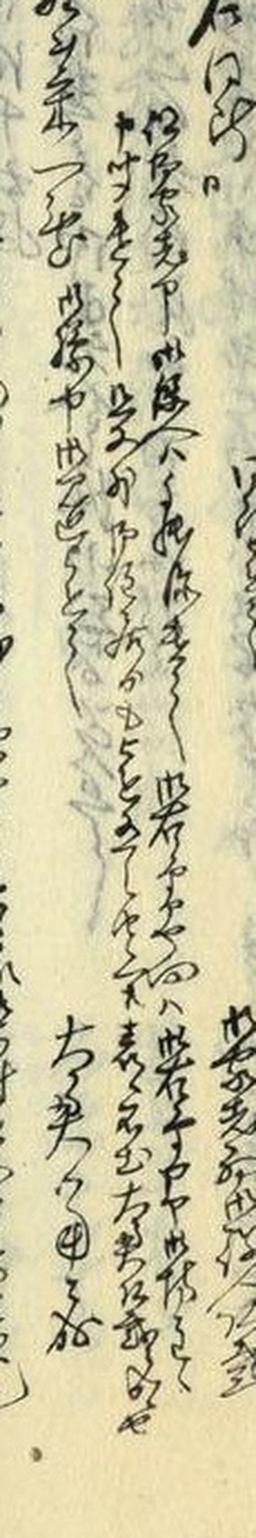申聞遣之且又外御住居ゟも被進有之候由候へ共表へ不出大奥頂戴被成候由
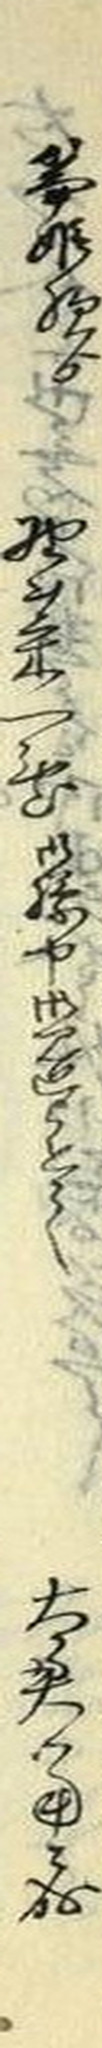箏姫様ゟ野菜一台御朦中御見廻被進之大奥御用被成
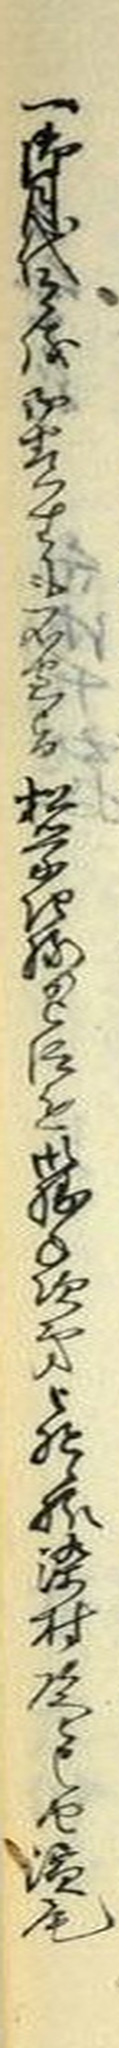一御月代之儀御養生も不宜旨松栄院様ゟ被仰進御勝手次第被遊候様染村殿被申候由浜尾
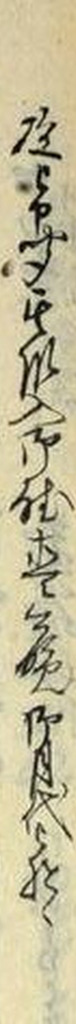殿被申聞其段入御聴直ニ今晩御月代被遊候
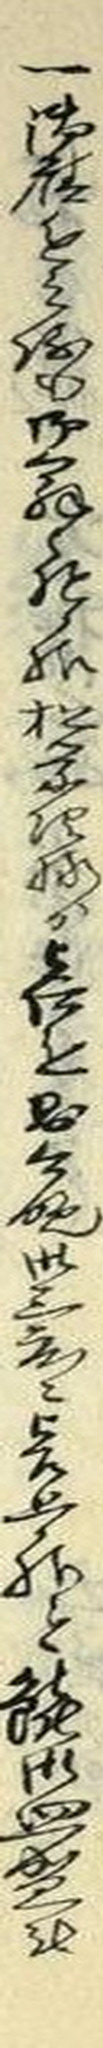一御精進之儀も御解被遊候様松栄院様ゟ被仰進則今晩御三度ニ被召上候様ニと鱚於皿盛被
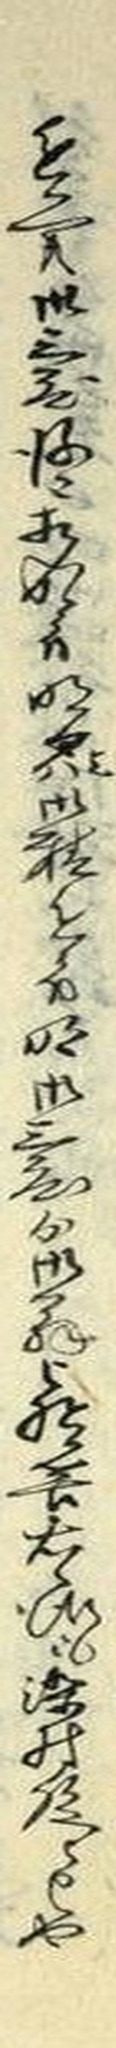進候へ共御三度後ニ相成候ニ付明日迄ハ御精進ニ付明御三度ゟ御解被遊候筈右之趣も染村殿被申候由
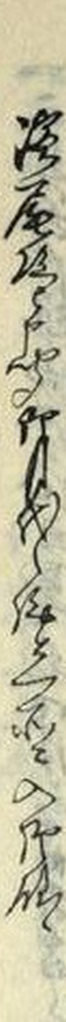浜尾殿被申聞御月代之儀と一所ニ入御聴候
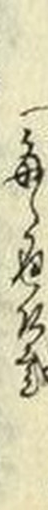毎之通頂戴
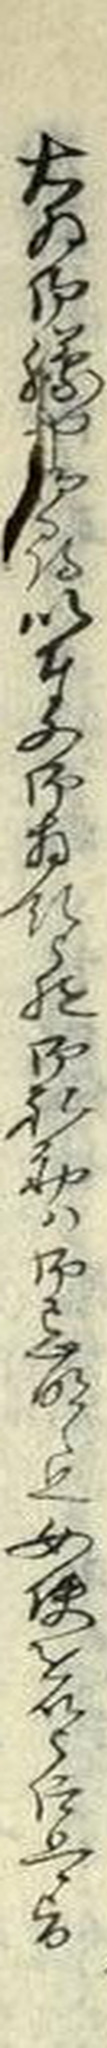右為御朦中御尋以奉文御拝領被遊候御礼勤ハ御忌明之上女使を以被仰上候旨
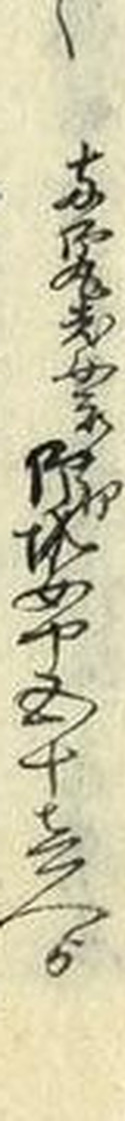両御丸老女衆初御城女中五十壱人ゟ
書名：少傅日録抄（斉善付側向頭取日記、在府）
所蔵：福井県文書館 Fukui Prefectural Archives
